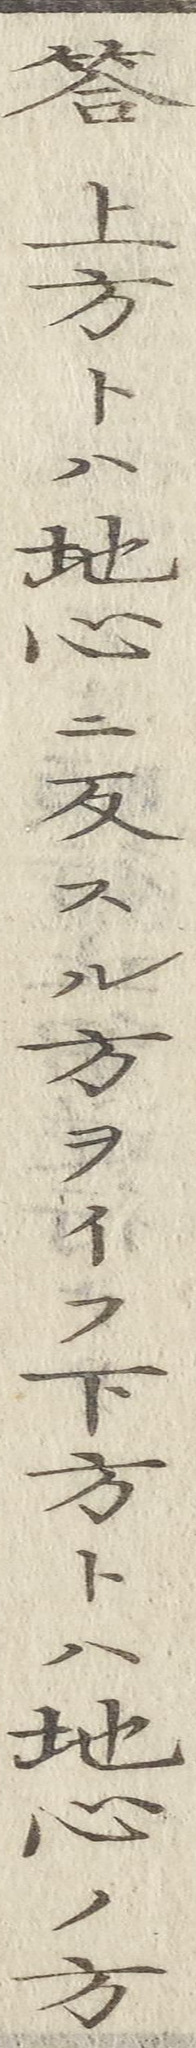答上方トハ地心ニ反スル方ヲイフ下方トハ地心ノ方
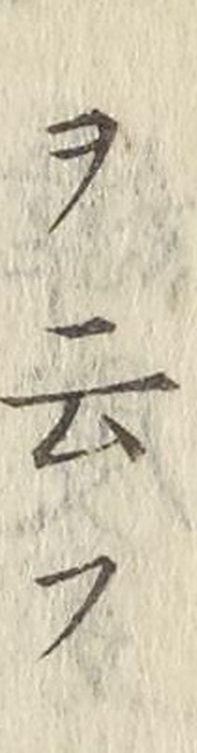ヲ云フ
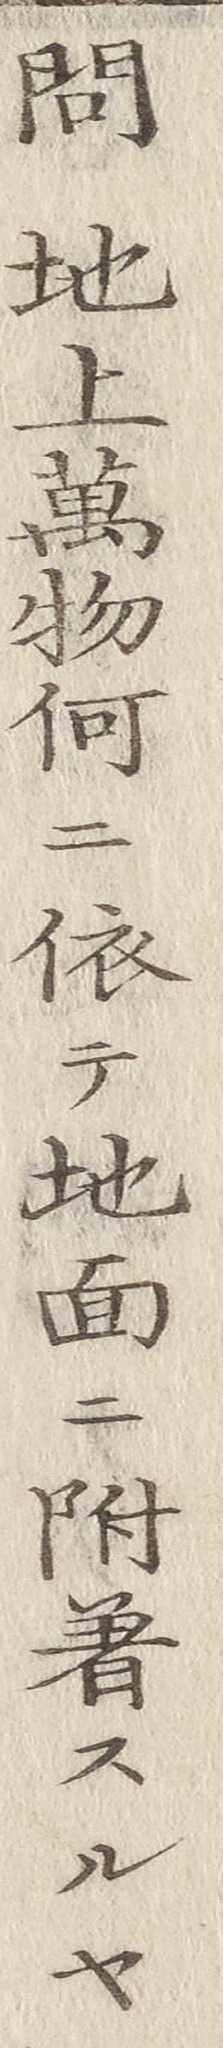問地上万物何ニ依テ地面ニ附着スルヤ
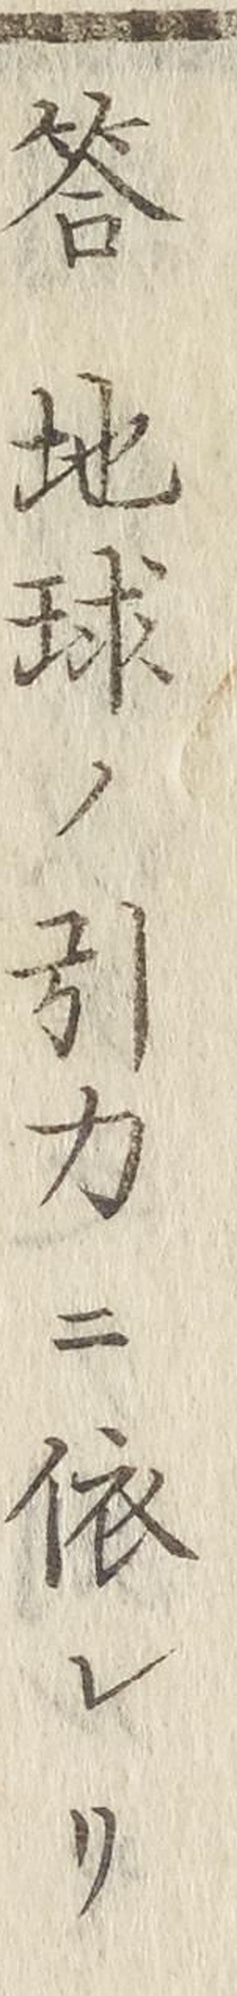答地球ノ引力ニ依レリ
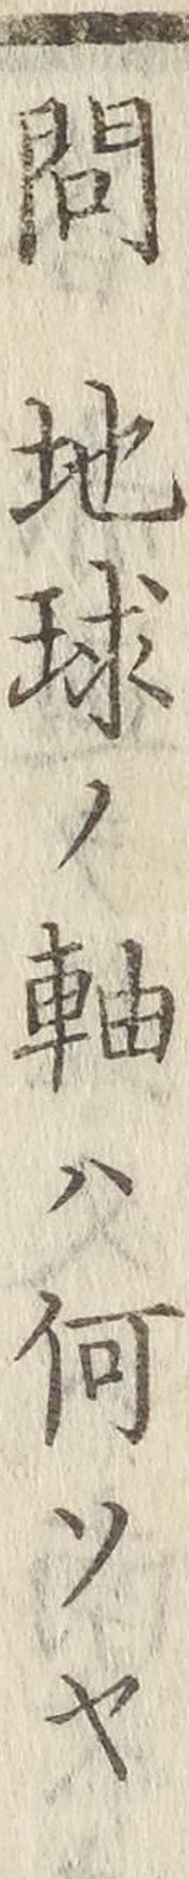問地球ノ軸ハ何ソヤ
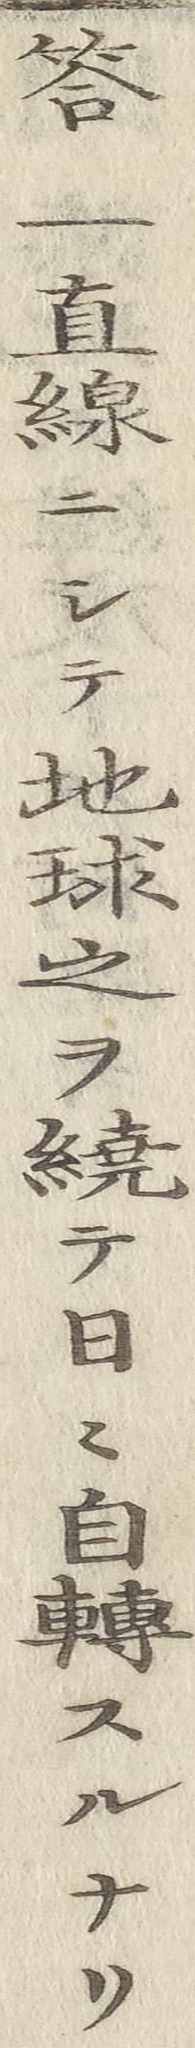答一直線ニシテ地球之ヲ繞テ日〻自転スルナリ
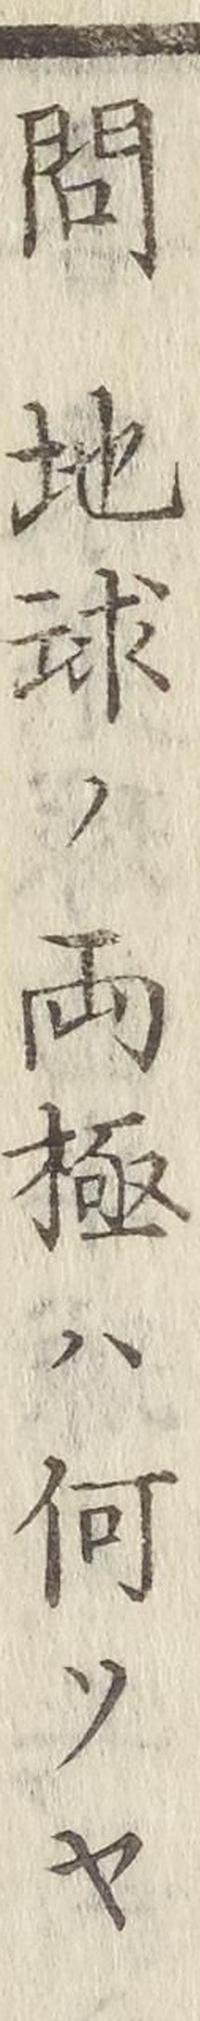問地球ノ両極ハ何ソヤ
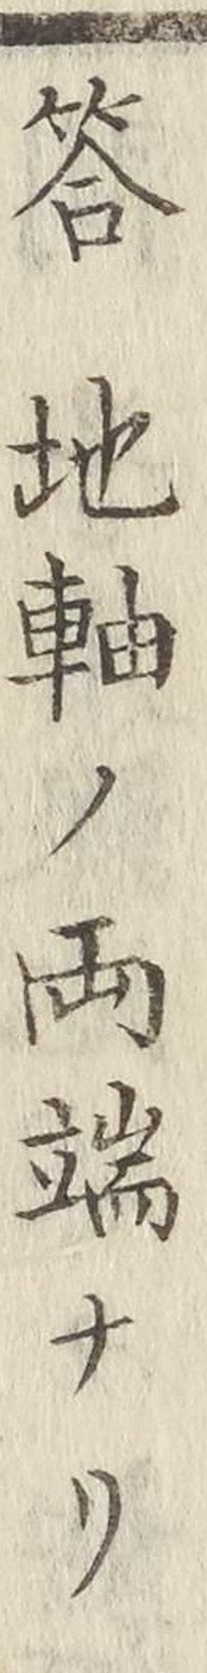答地軸ノ両端ナリ
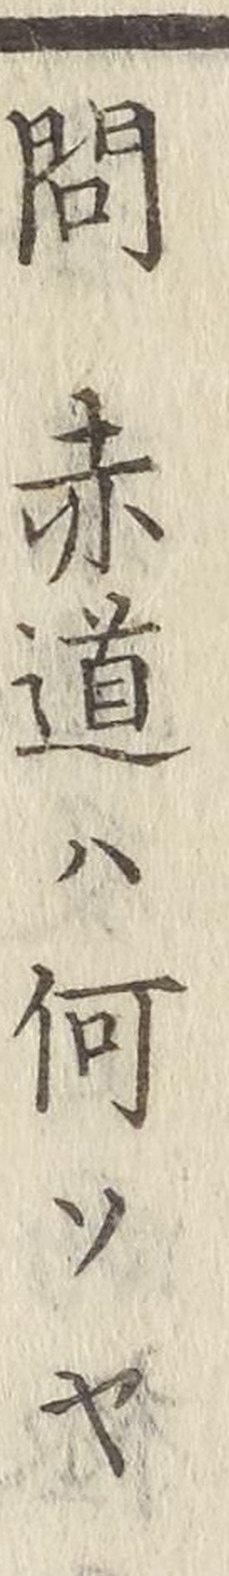問赤道ハ何ソヤ
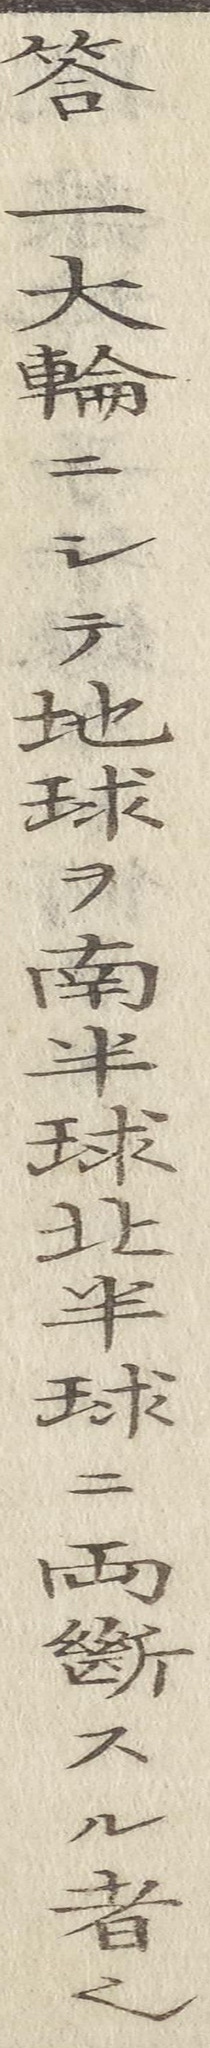答一大輪ニシテ地球ヲ南半球北半球ニ両断スル者也
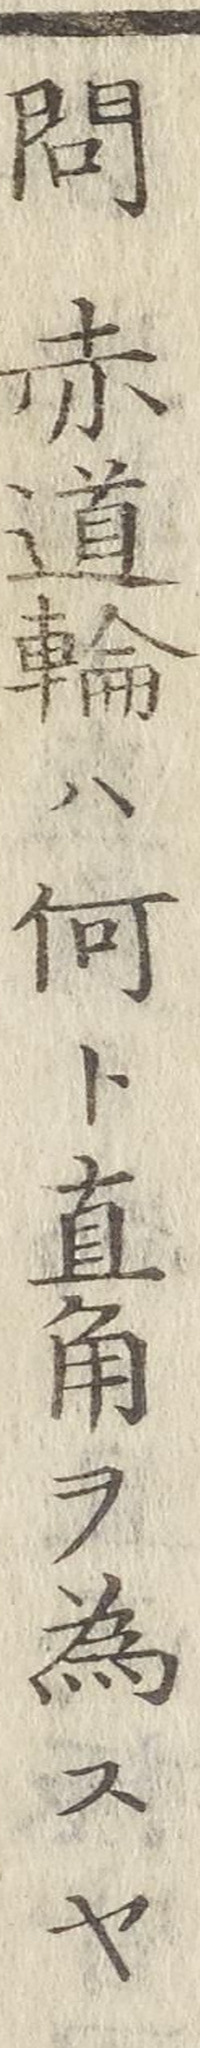問赤道輪ハ何ト直角ヲ為スヤ

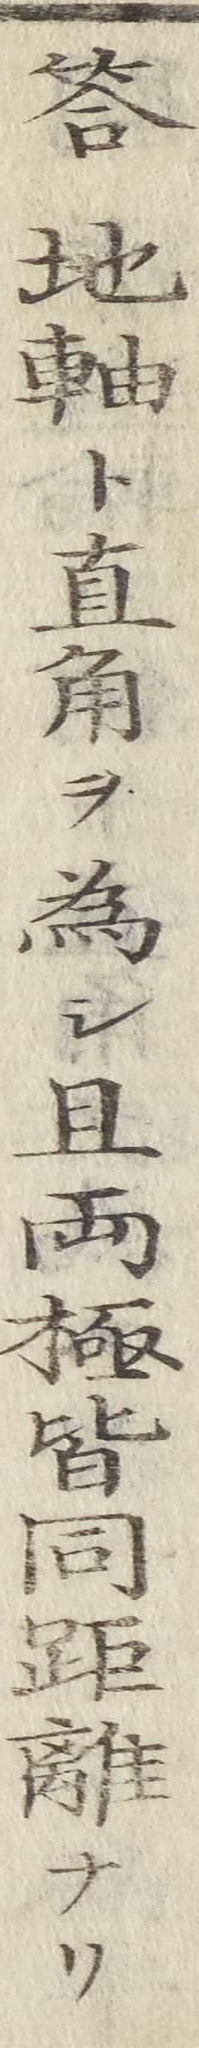答地軸ト直角ヲ為シ且両極皆同距離ナリ
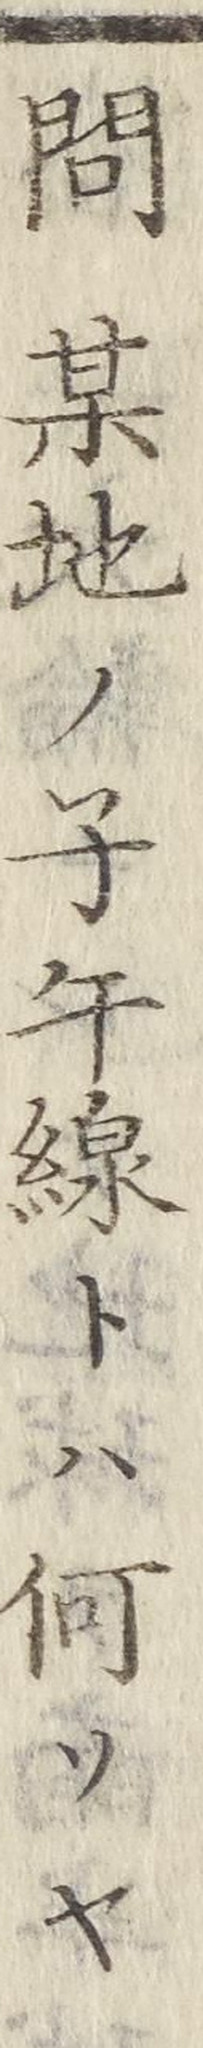問某地ノ子午線トハ何ソヤ
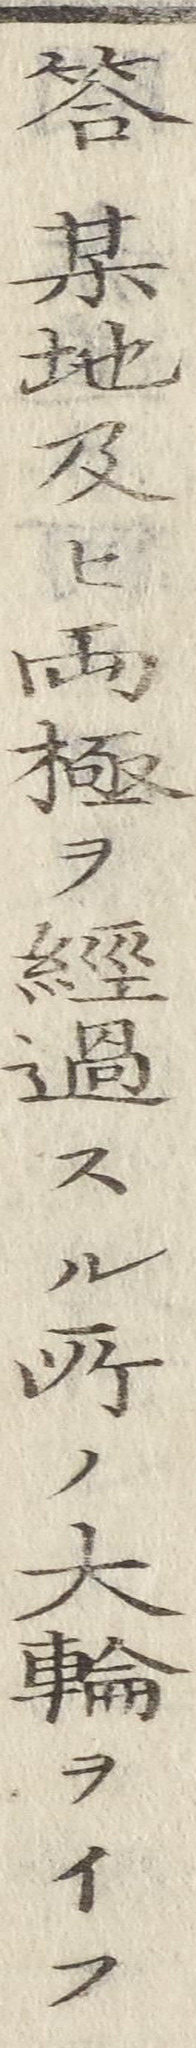答某地及ヒ両極ヲ経過スル所ノ大輪ヲイフ
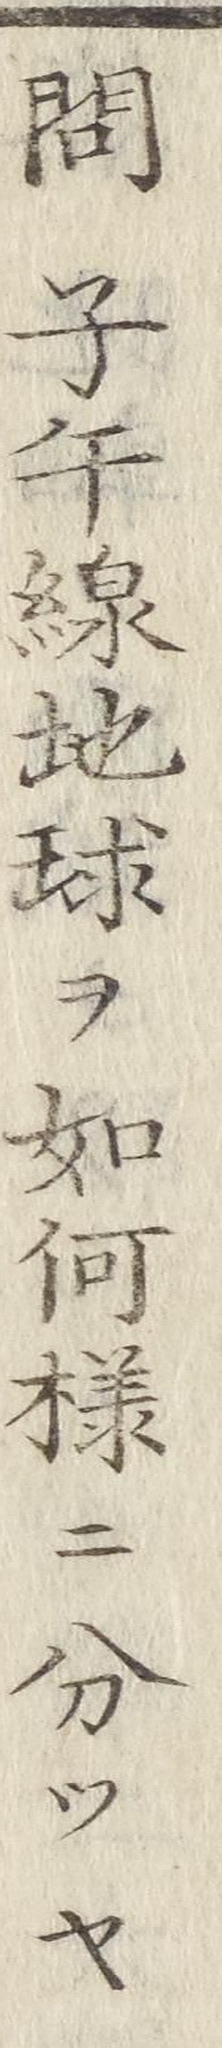問子午線地球ヲ如何様ニ分ツヤ
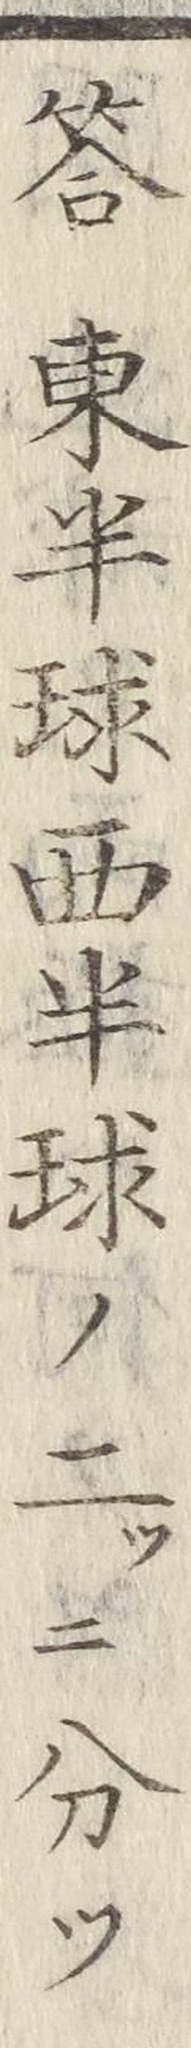答東半球西半球ノ二分ツ
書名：星学圖説　上
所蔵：東京大学地震研究所図書室 Earthquake Research Institute Library, The University of Tokyo, JAPAN
